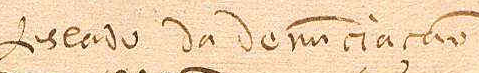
teslado da den̅uciação
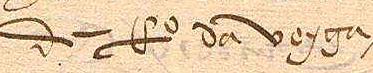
de Ro da veyga /
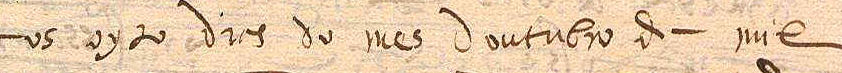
os oyto dias do mes doutubro de mil
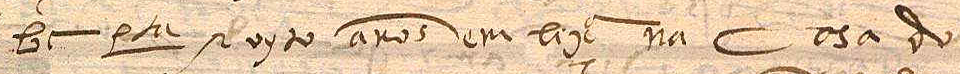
bc Lta e oyto a̅nos em lixa na Casa do
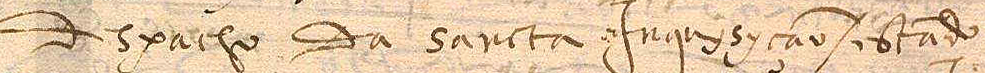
despacho da sancta Jnquysyção / esta̅do
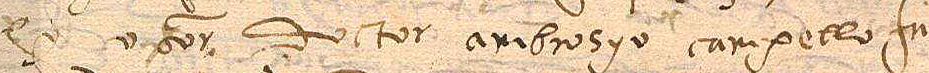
hy o sōr doctor ambrosyo campello Jn
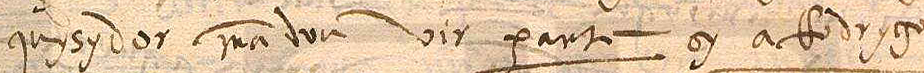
quysydor m̅adou vir ꝑante sy a Rodrygo
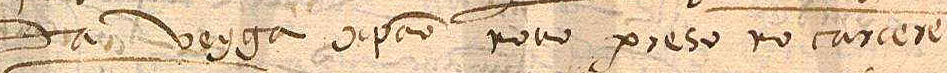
da veyga xpão nouo preso no carcere
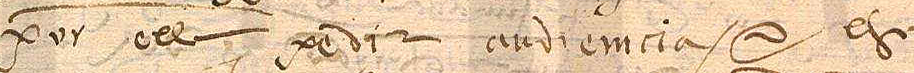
por elle pedir audiemcia / e lhe
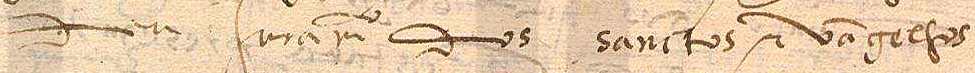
deu Juramto dos sanctos eva̅gelhos
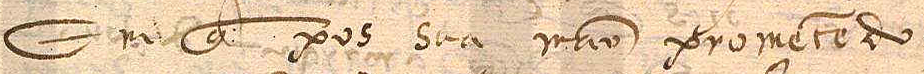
Em q̅ pos sua mão promet̅edo
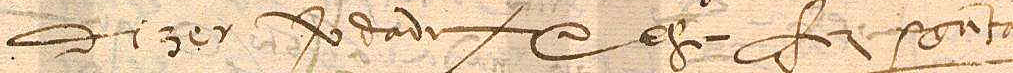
dizer ꝟdade / e lhe fez ꝑgu̅ta
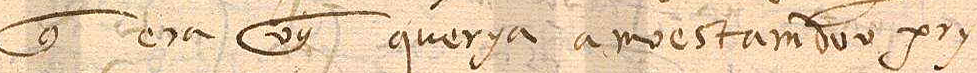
q̅ era o q̅ querya amoestamdoo pry
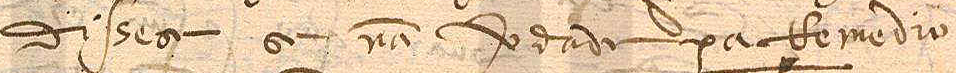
dissese se n̅a ꝟdade ꝑa Remedio
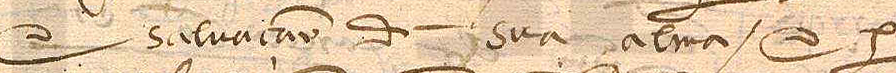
e saluação de sua alma / e ꝑ
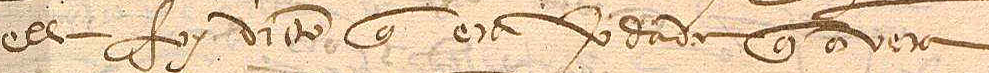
elle foy di̅cto q̅ era ꝟdade q̅ avera
